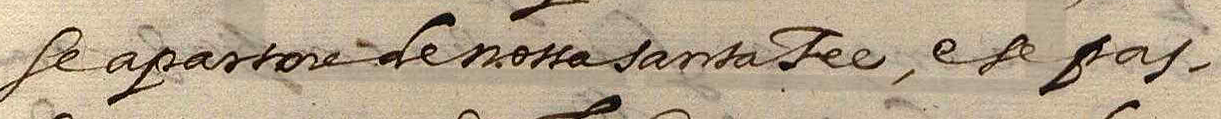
se apartou de nossa santa Fee, e se pas
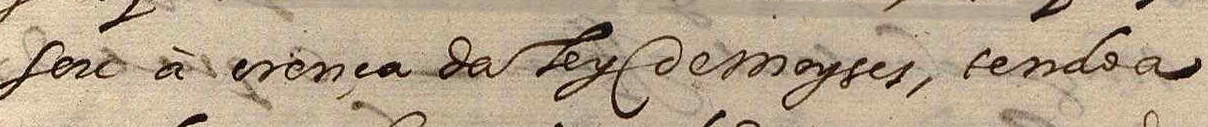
sou à crença da Ley de moyses, tendoa
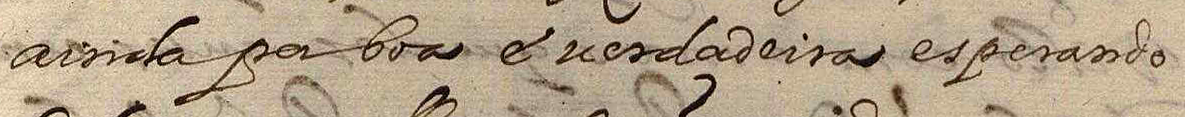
ainda por boa & uerdadeira esperando
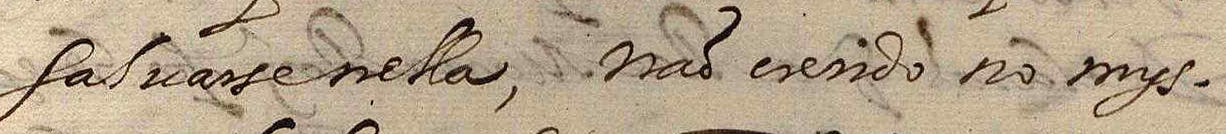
saluarse nella, naõ crendo no mys
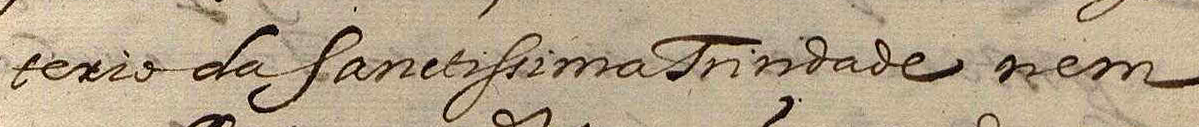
terio da Sanctissima Trindade nem
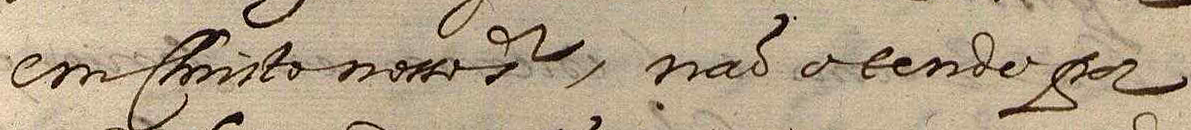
em Christo nosso sor, naõ o tendo por
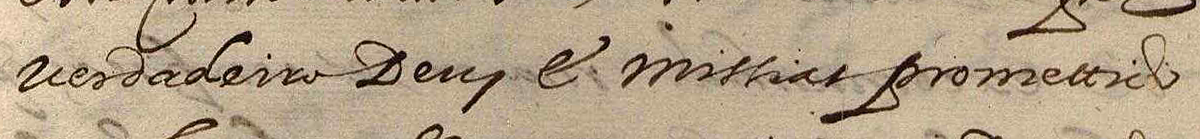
uerdadeiro Deus & missias promettido
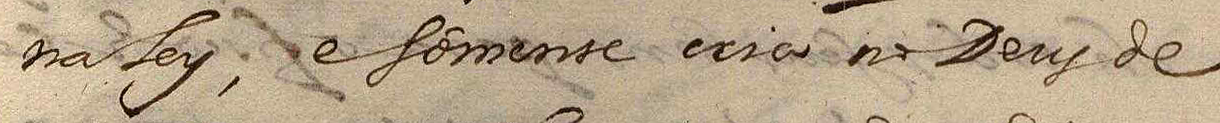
na ley, e sómente cria no Deus de
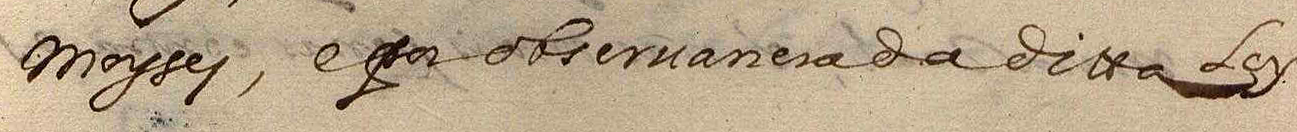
moyses, e por obseruancia da ditta Ley
